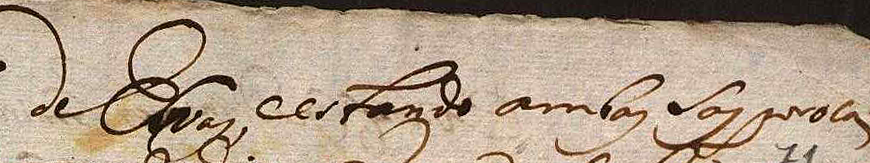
de Elvas, e estando ambos sos por oca
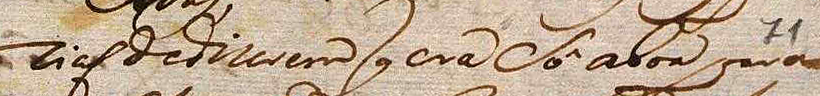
ziaõ de dizerem q̄ era Só a boa para
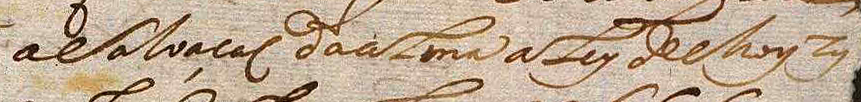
a Salvaçaõ da aLma a Ley de Moyzes,
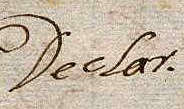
Declar.
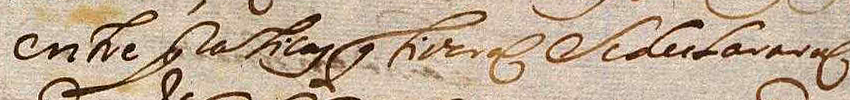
entre pRaticas q̄ tiveraõ Se declararaõ
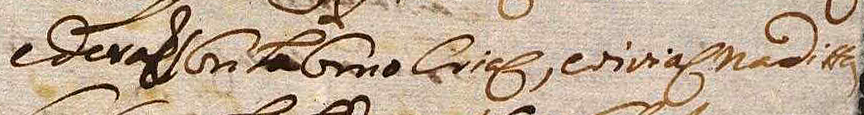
e deraõ Conta Como Criaõ, e viviaõ na ditta
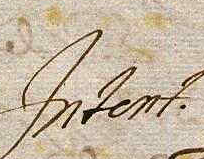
Jntent.
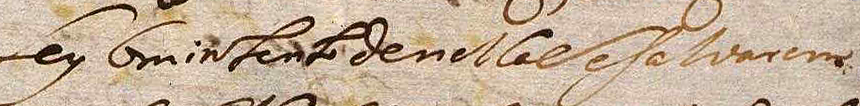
Ley Com intento de nella Se salvarem
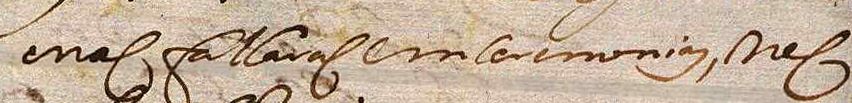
e naõ fallaraõ em ceremonias, nē
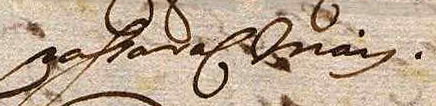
passaraõ mais.
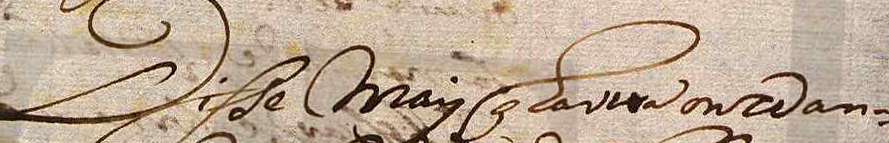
Disse mais q̄ havera onze an
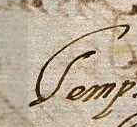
Temp.
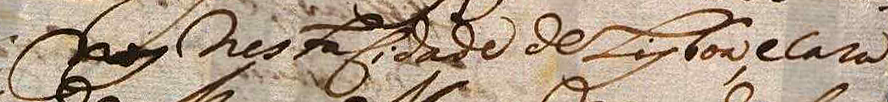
nos nesta Cidade de Lisboa, e caza
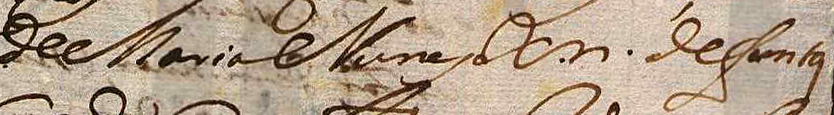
de Maria Nunes x.n. defunta
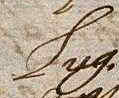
Lug.
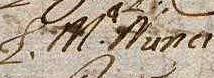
L. Ma Nunes
